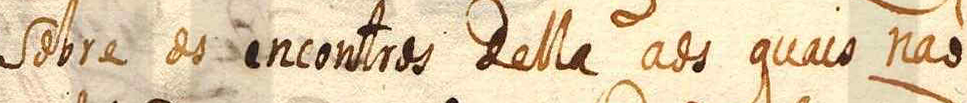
Sobre os encontros della aos quais naõ
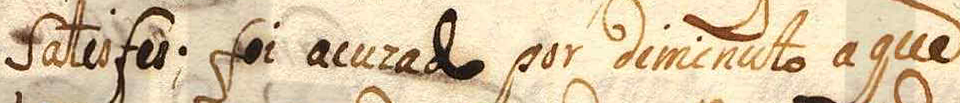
Satisfes; foi acuzado por diminuto a que
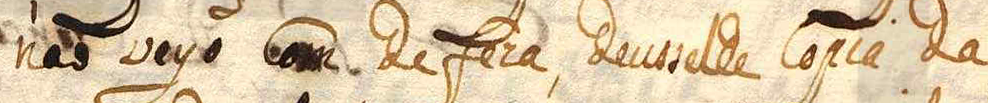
nao veyo Com defeza, deus se lhe Copia da
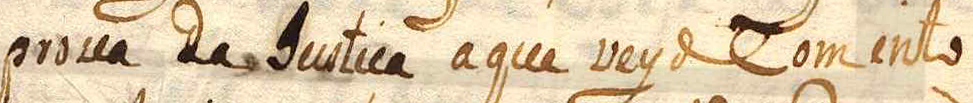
prova da Justiça a que veyo Com into
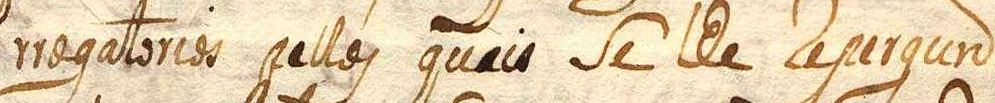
rrogatorios pellos quais Se lhe Repergun
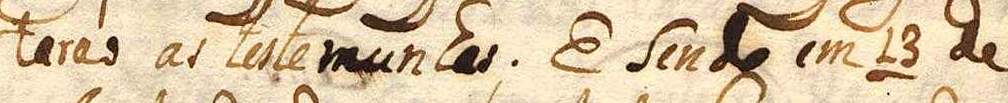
tarão as testemunhas; E Sendo em 13 de
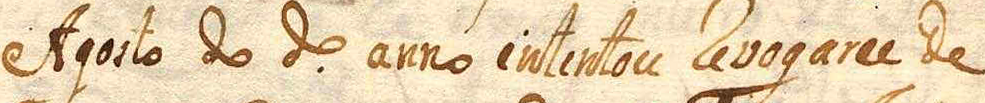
Agosto do d.o anno intentou Revogaree de
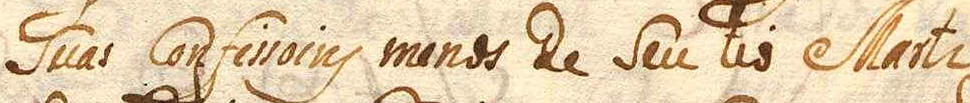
Suas Confissoins menos de seu tio Marti
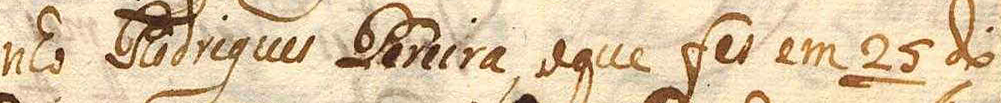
nho Rodrigues Pereira, o que fes em 25 do
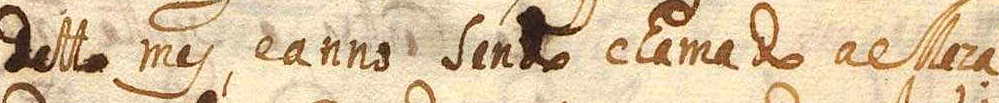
sitto mes, e anno sendo chamado a Meza;
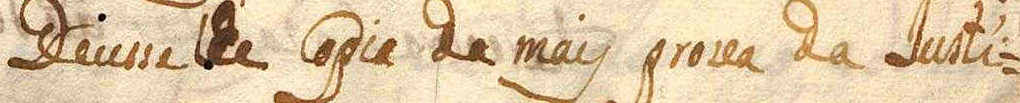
Deus se lhe Copia da mais prova da Justi
